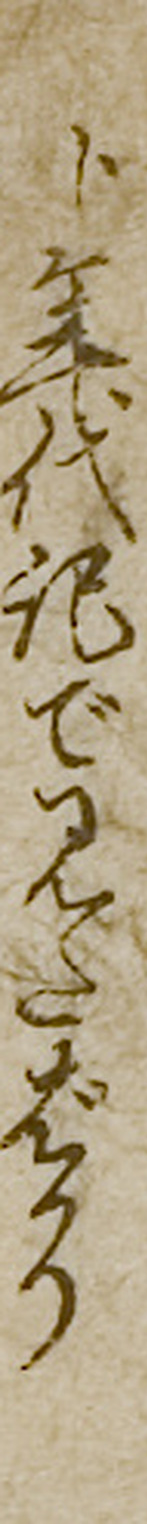ト年代記で見たばかり
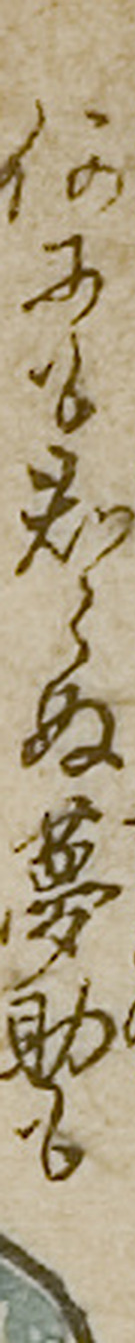何にも知らぬ夢助も
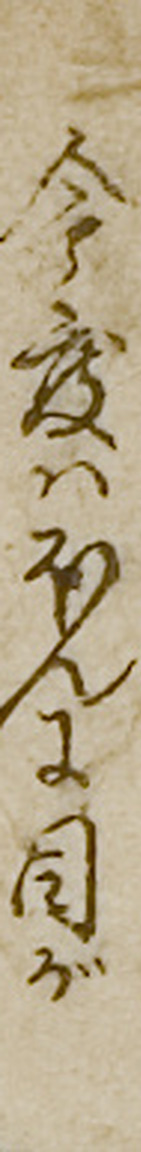今度はほんに目が
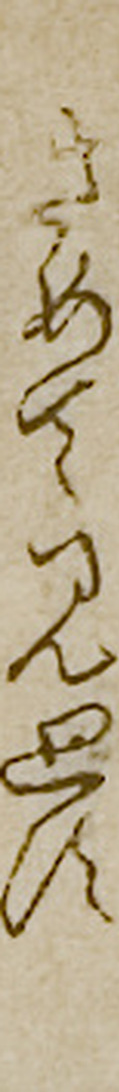さめて見廻す
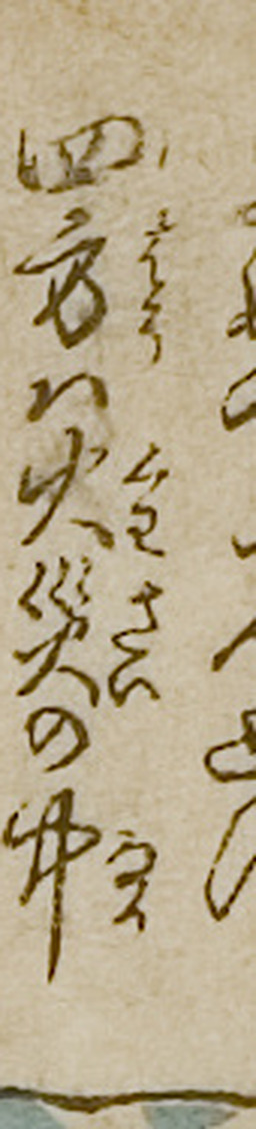四方は火災の中
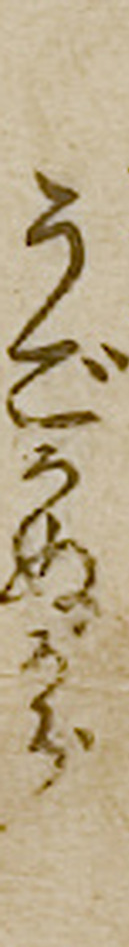うごかぬから
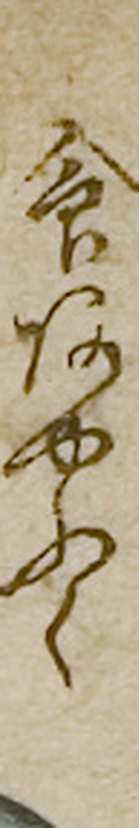命あやふく
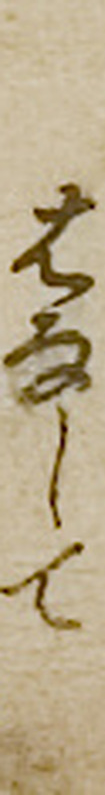はなして
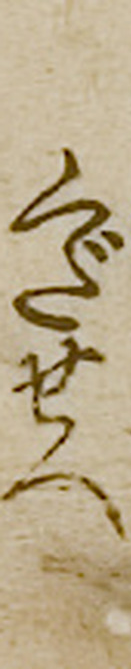くだせへ
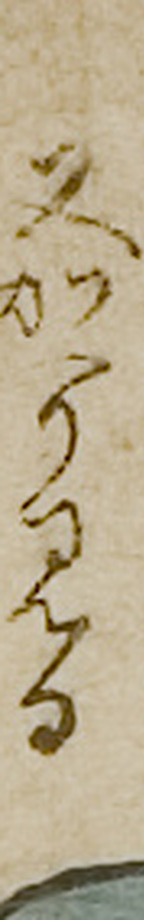又かゝり見る
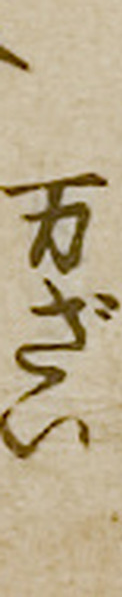万ざい
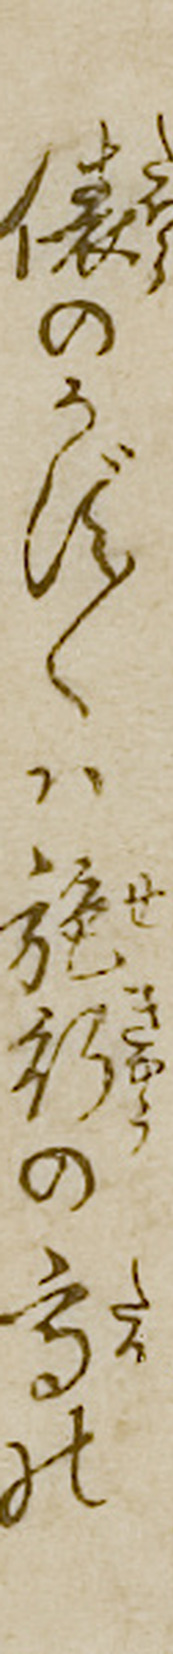俵のかず〳〵は施行の高の
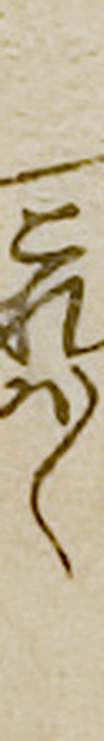乁これは〳〵
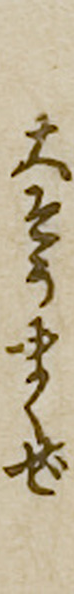大そうまくぜ
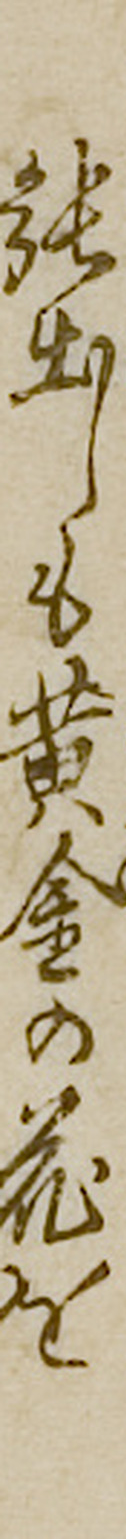張出しも黄金の花を
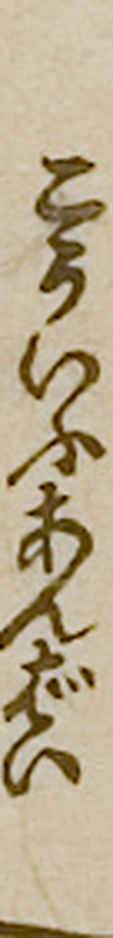こういふあんばい
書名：[大黒のつち]
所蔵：東京大学総合図書館 General Library in the University of Tokyo, JAPAN
